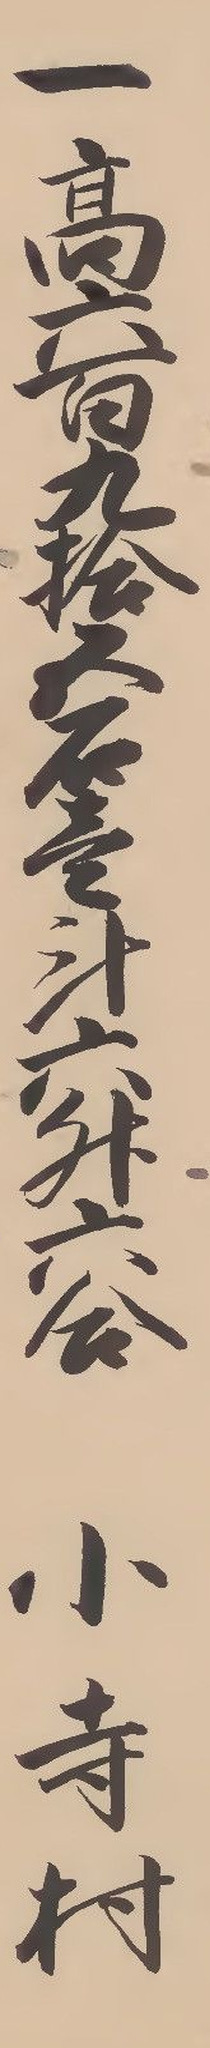一高六百九拾五石壱斗六升六合小寺村

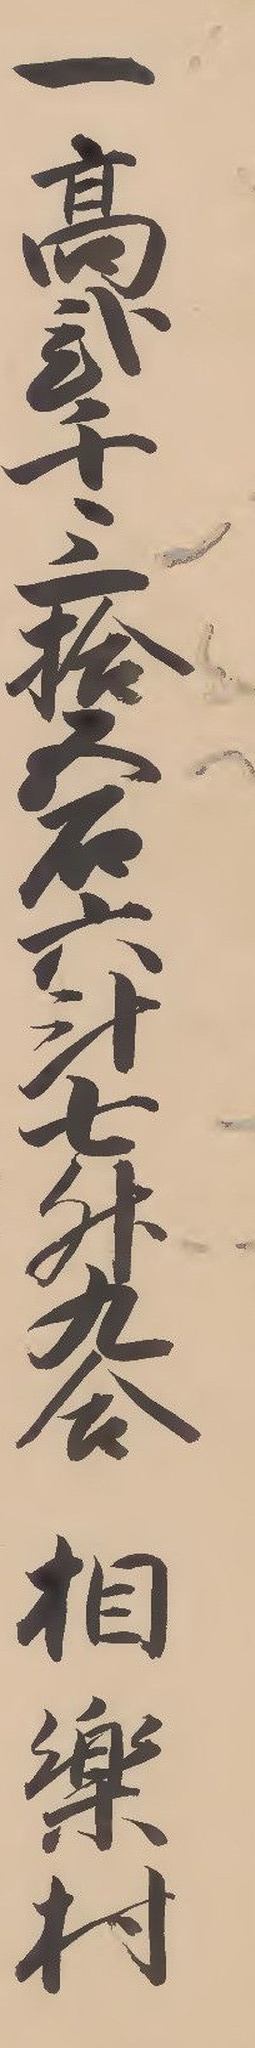一高弐千三拾五石六斗七升九合相楽村
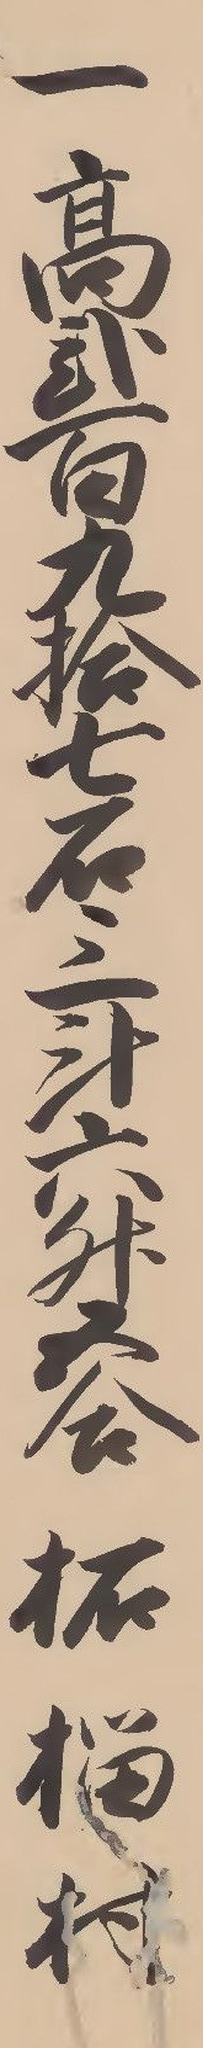一高弐百九拾七石三斗六升五合柘榴村
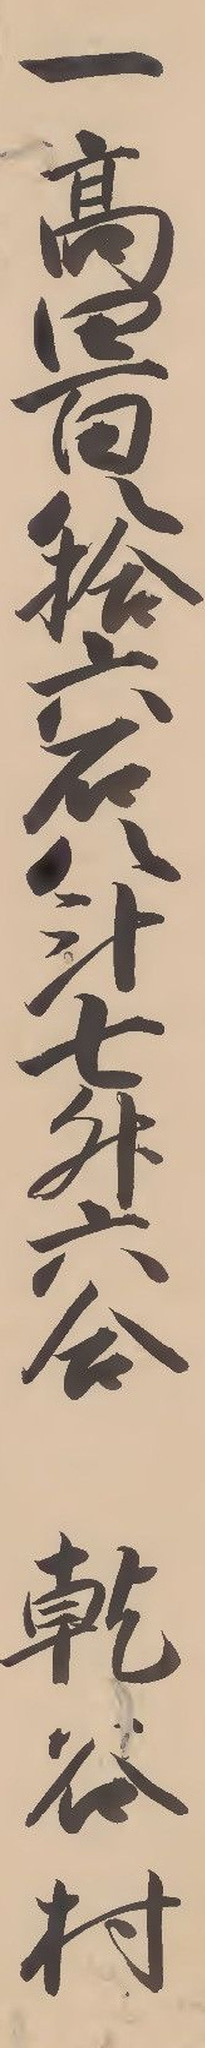一高四百八拾六石八斗七升六合乾谷村
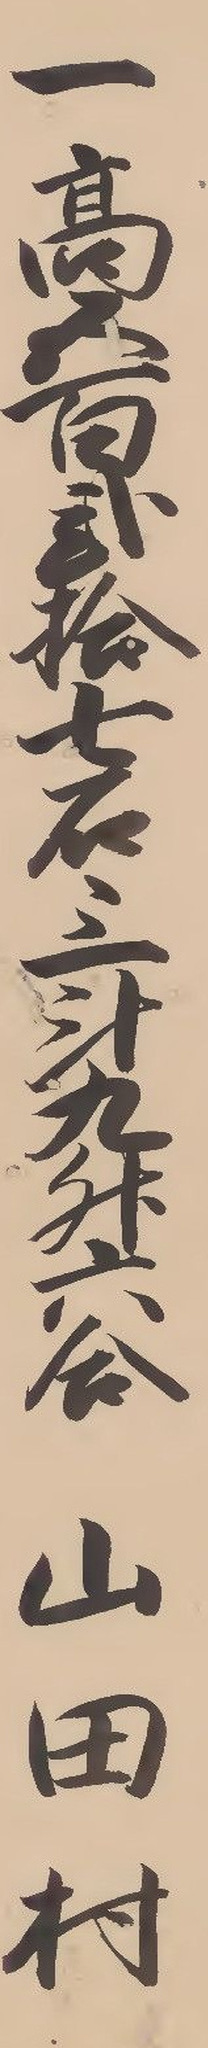一高五百弐拾七石三斗九升六合山田村
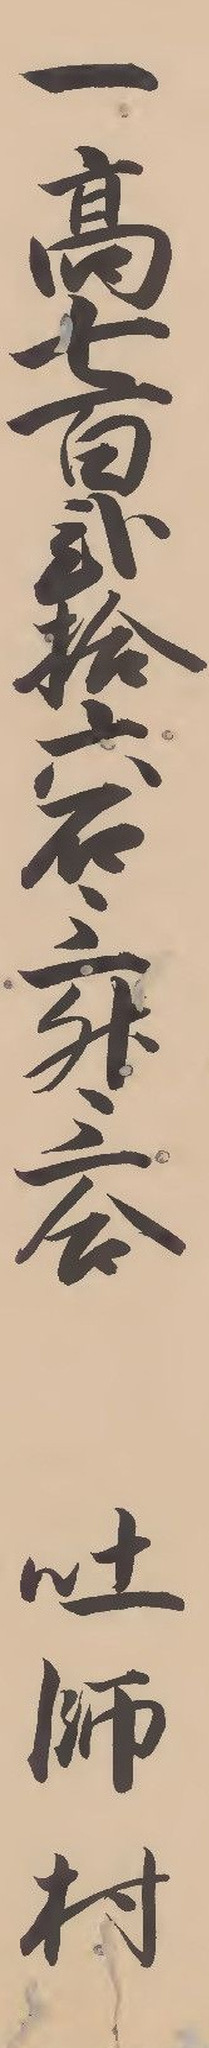一高七百弐拾六石三升三合吐師村
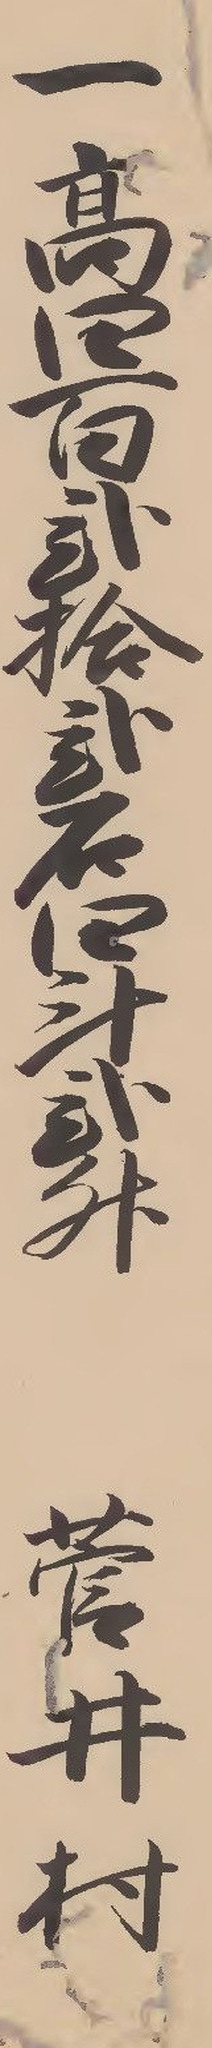一高四百弐拾弐石四斗弐升菅井村
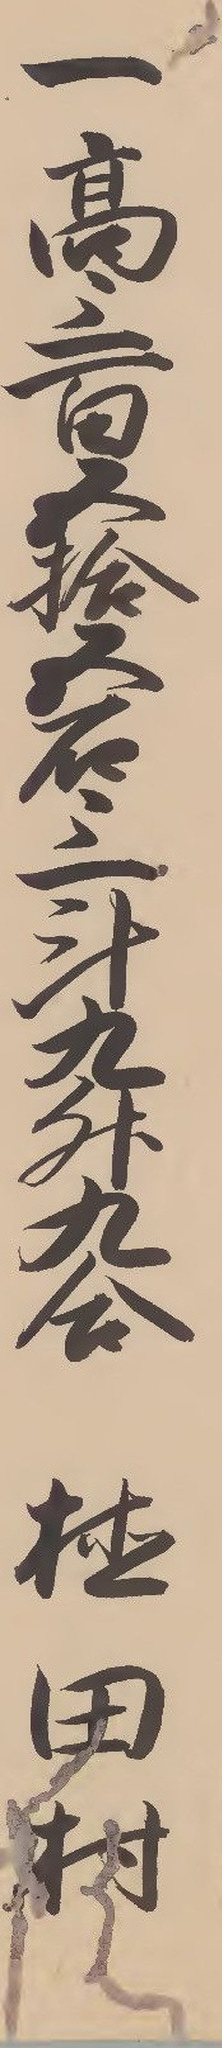一高三百五拾五石三斗九升九合植田村
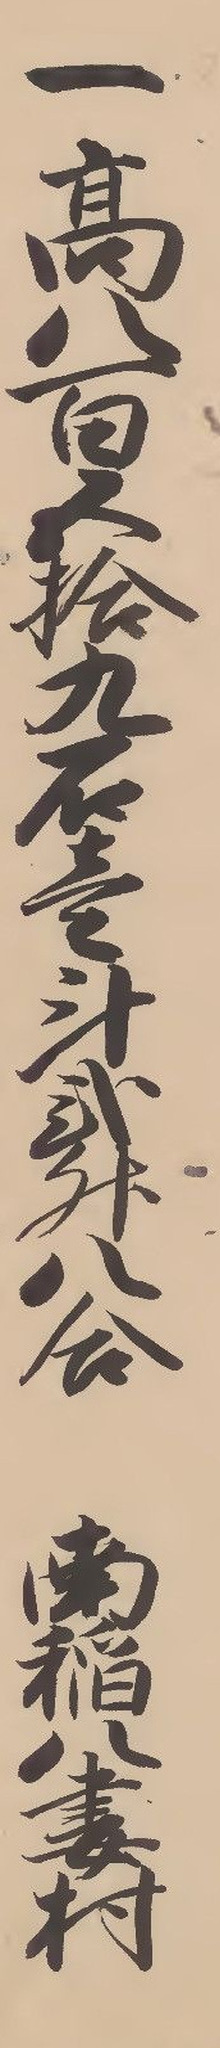一高八百五拾九石壱斗弐升八合南稲八妻村

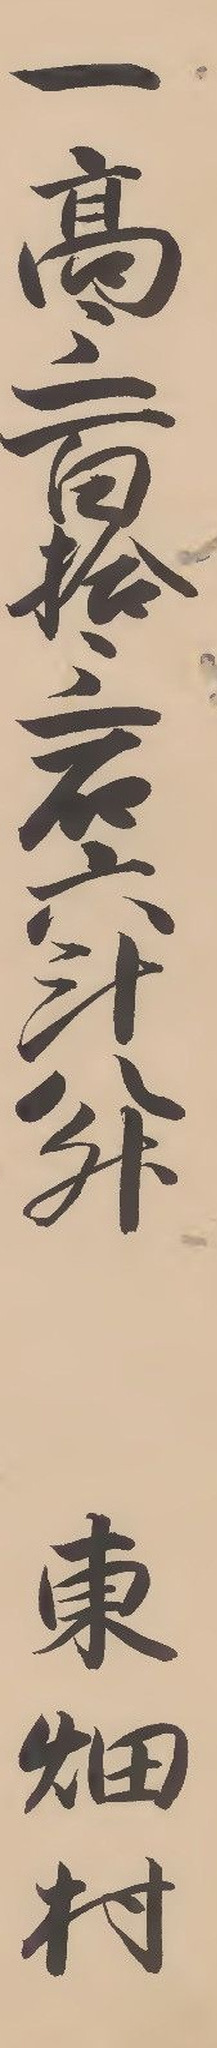一高三百拾三石六斗八升東畑村
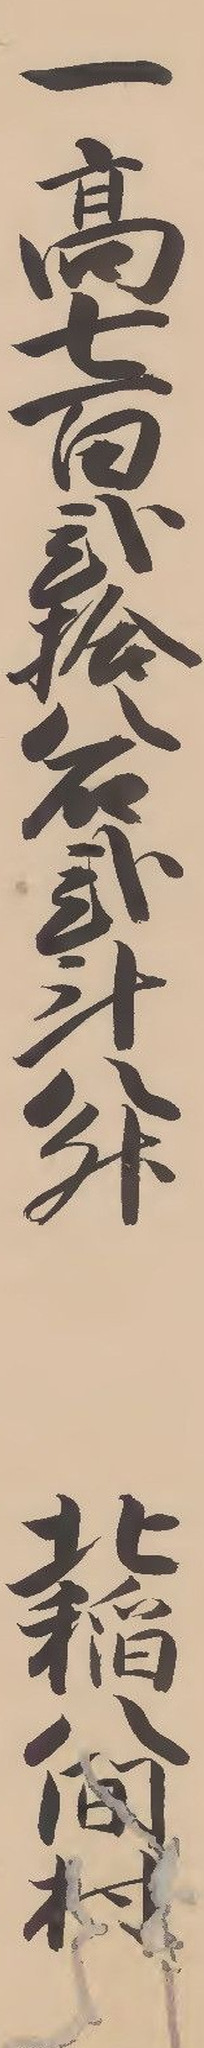一高七百弐拾八石弐斗八升北稲八間村
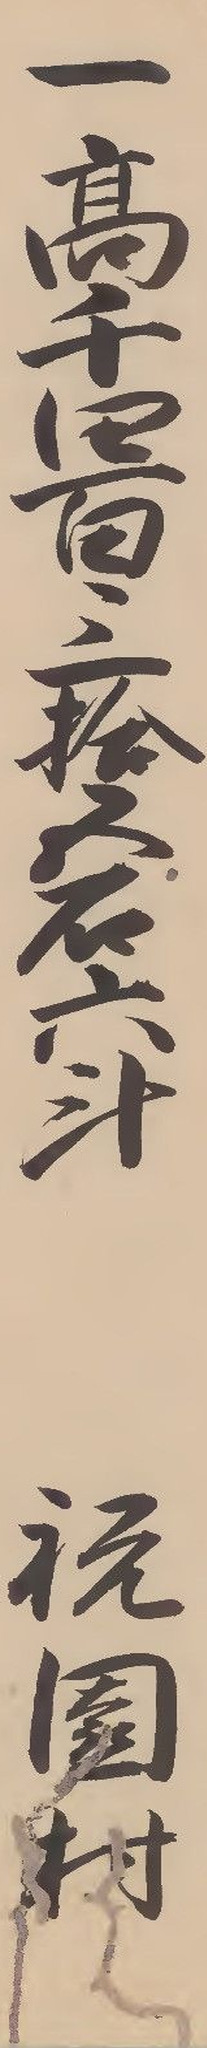一高千四百三拾五石六斗祝園村
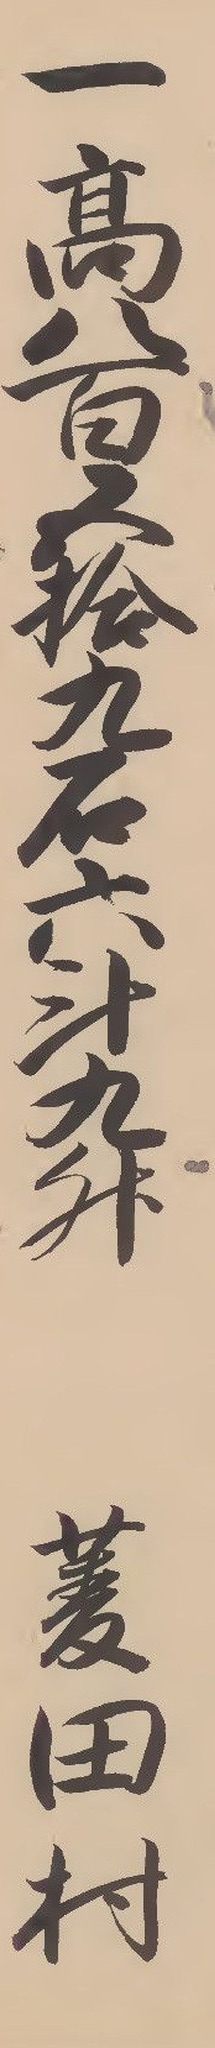一高八百五拾九石六斗九升菱田村

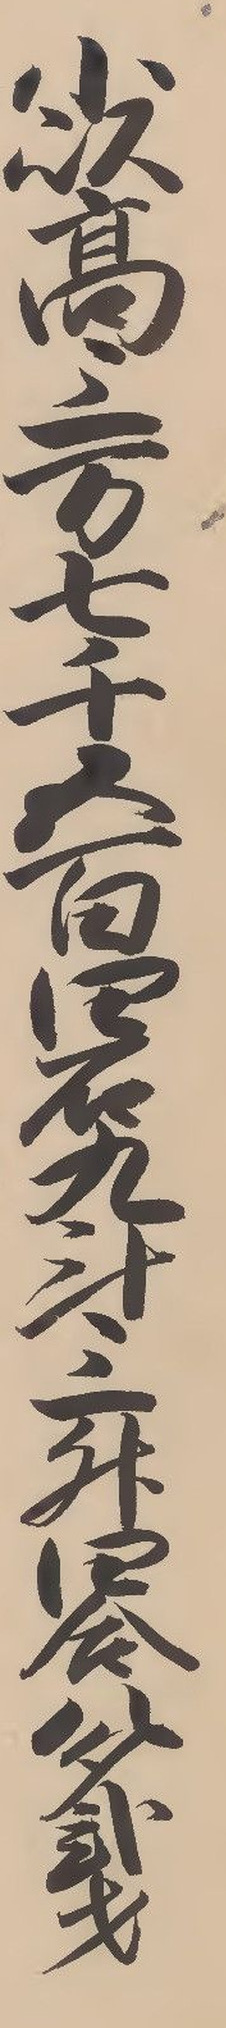小以高三万七千五百四石九斗三升四合八勺弐才
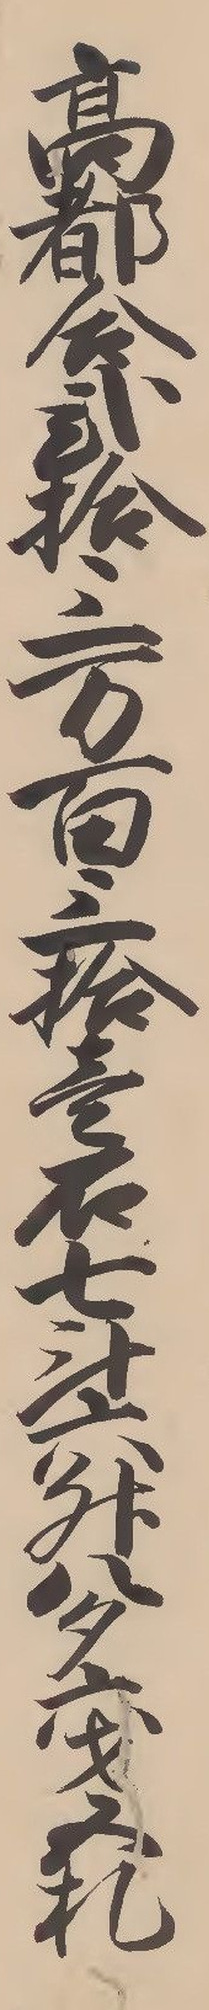高都合弐拾三万百三拾壱石七斗六升八勺六才五札
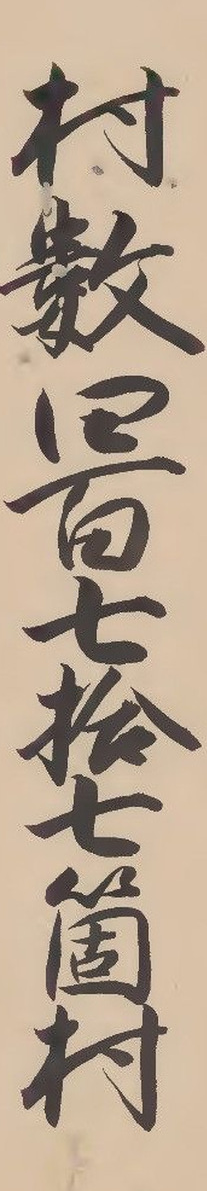村数四百七拾七箇村
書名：山城国郷帳
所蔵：国立公文書館 National Archives of Japan
